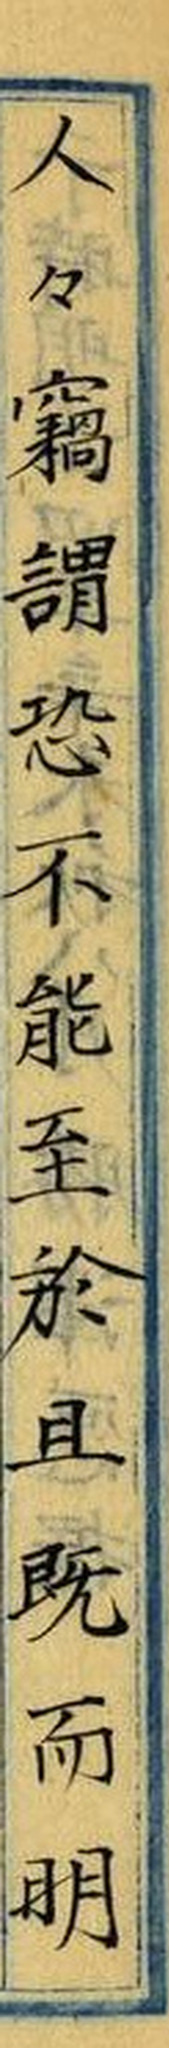人々竊謂恐不能至於且既而明
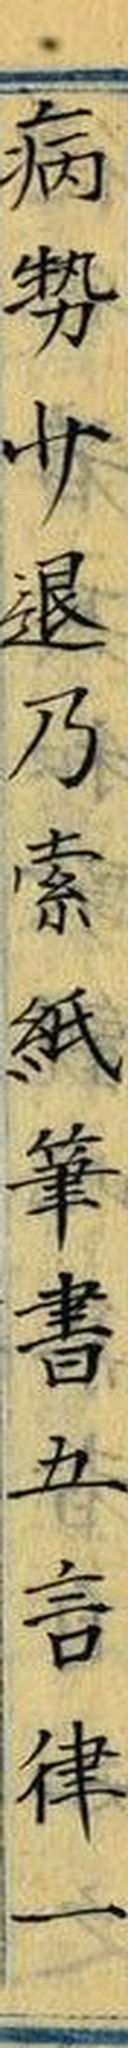病㔟少退乃索紙筆書五言律一
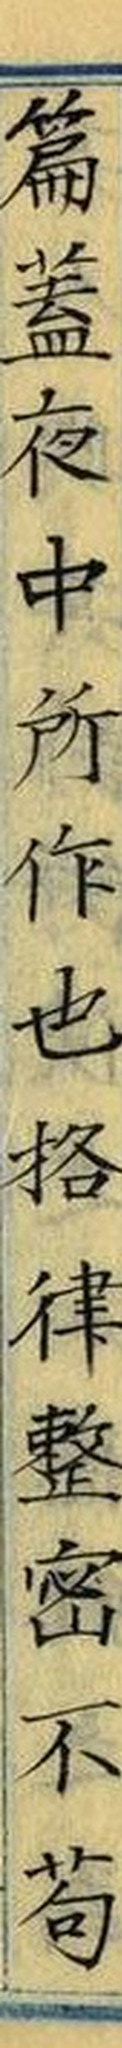篇蓋夜中所作也格律整密不苟
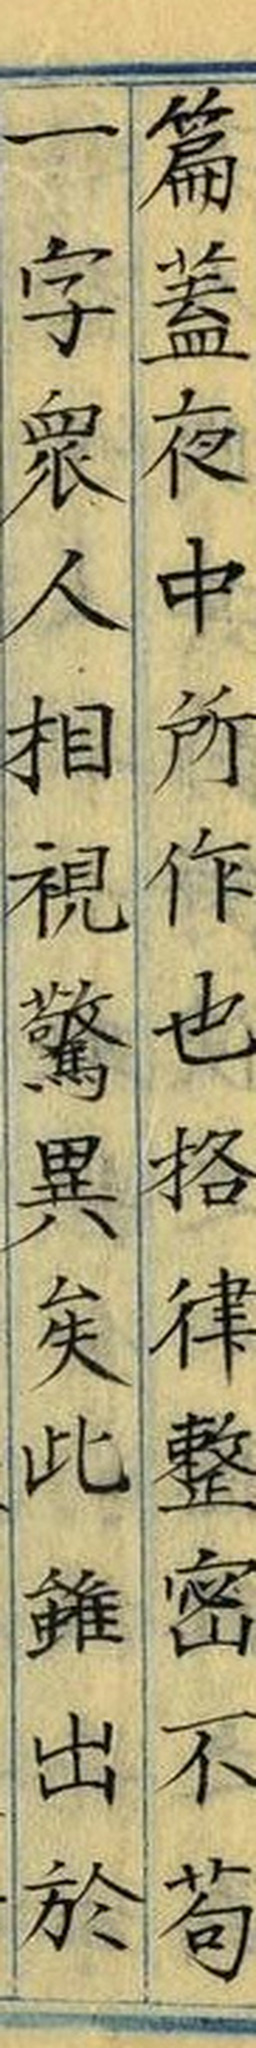一字衆人相視驚異矣此雖出於
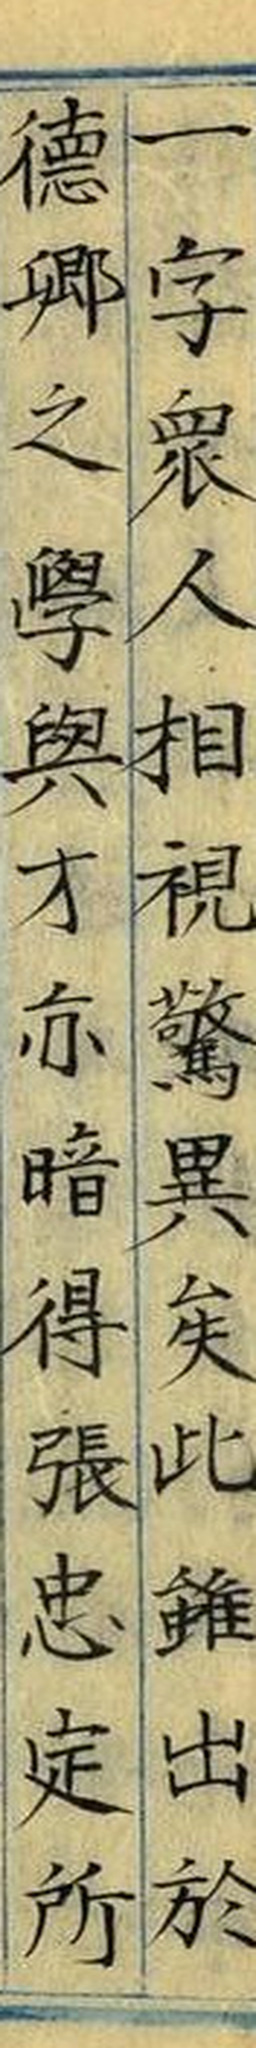德卿之學與才亦暗得張忠定所
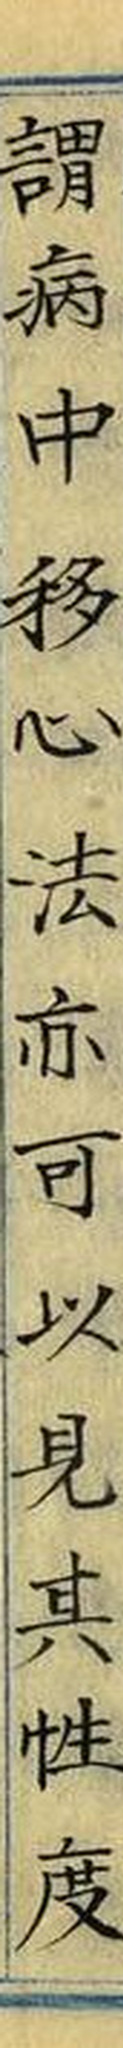謂病中移心法亦可以見其性度
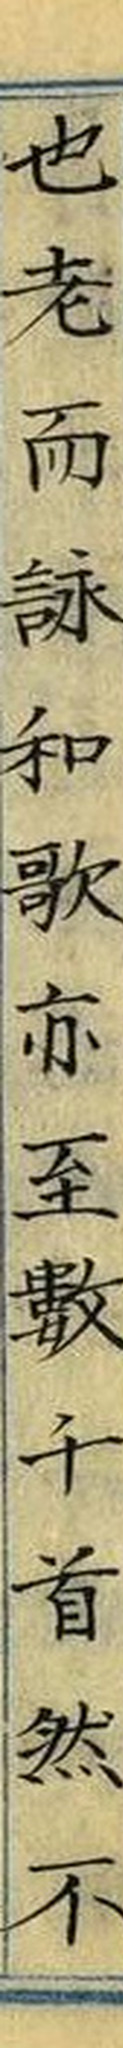也老而詠和歌亦至數千首然不
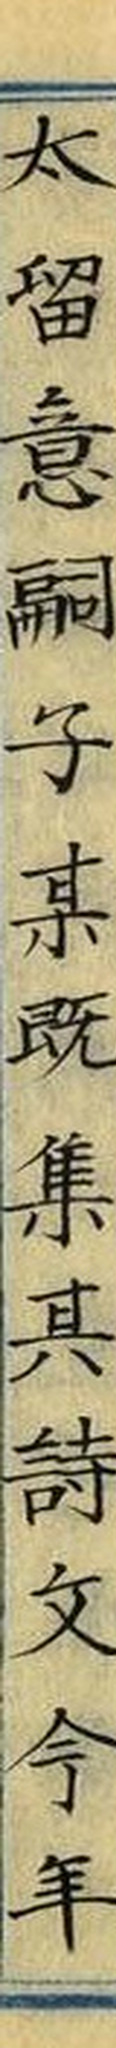太留意嗣子其既集其詩文今年
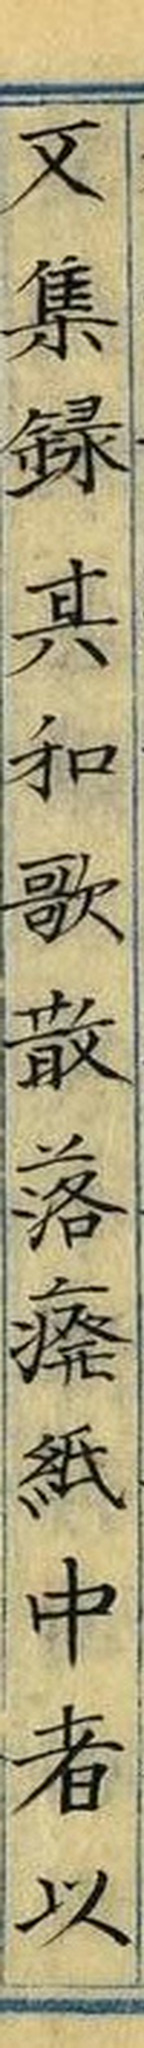又集録其和歌散落㾱紙中者以
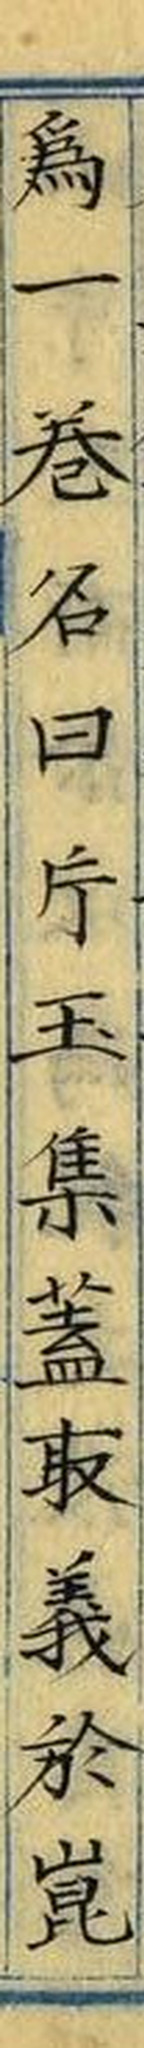爲一巻名曰片玉集蓋取義於崑

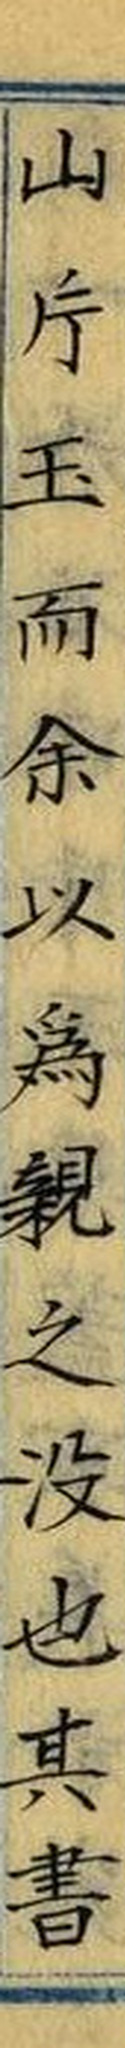山片玉而余以爲親之没也其書
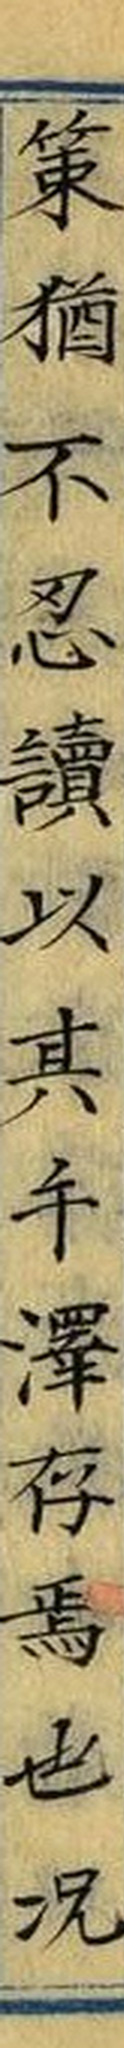策猶不忍讀以其手澤存焉也况
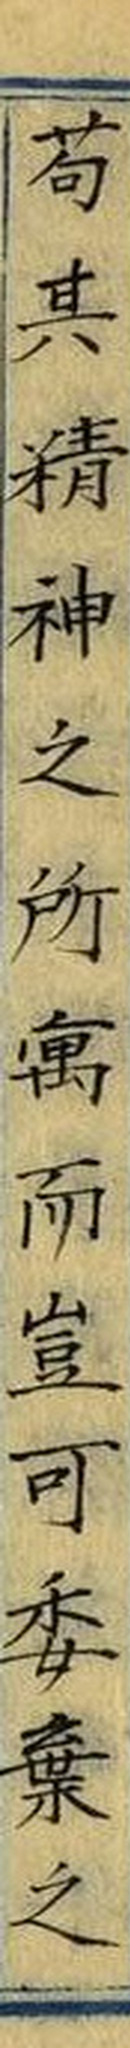苟其精神之所寓而豈可委棄之
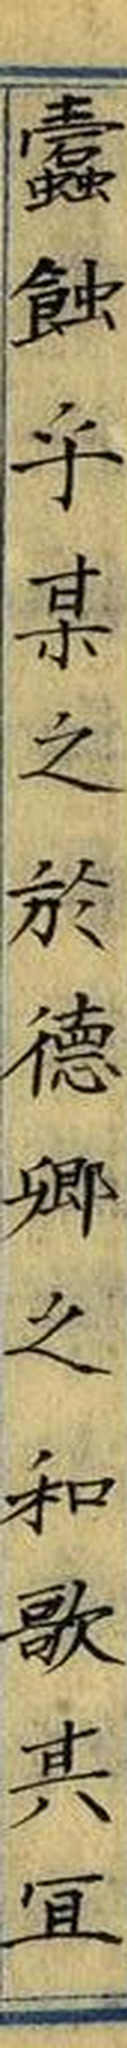蠧蝕乎某之於德卿之和歌其冝
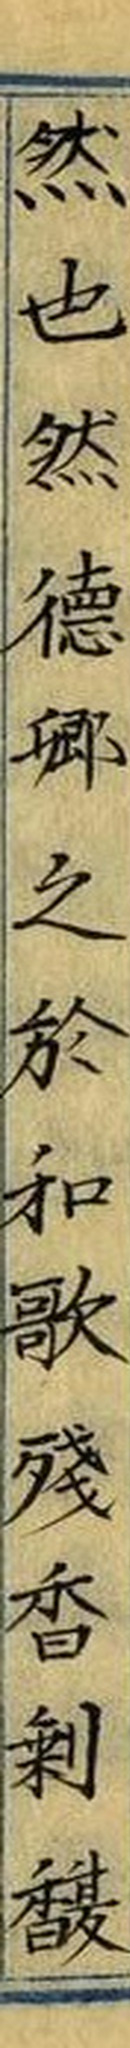然也然德卿之於和歌殘香剰馥
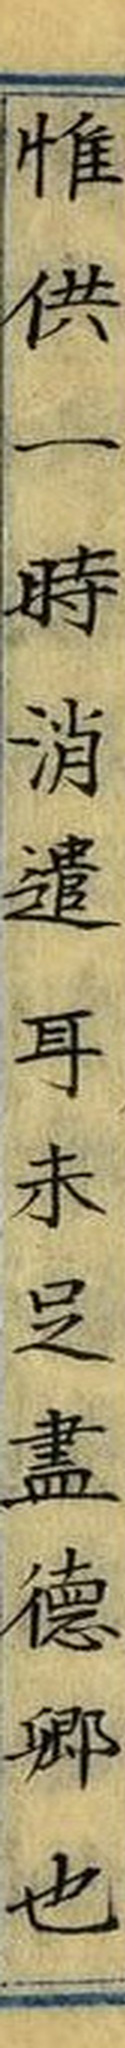惟供一時消遣耳未足𥁞德卿也
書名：温古集 四巻
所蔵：福井県文書館 Fukui Prefectural Archives
